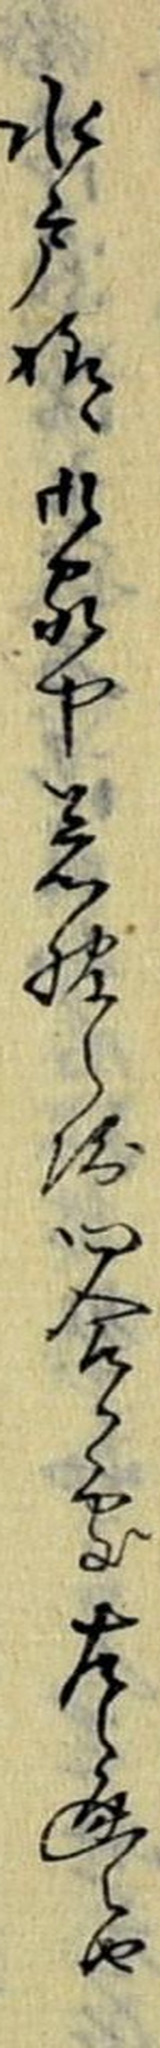水戸様御家中着服之儀問合候処左之通之由
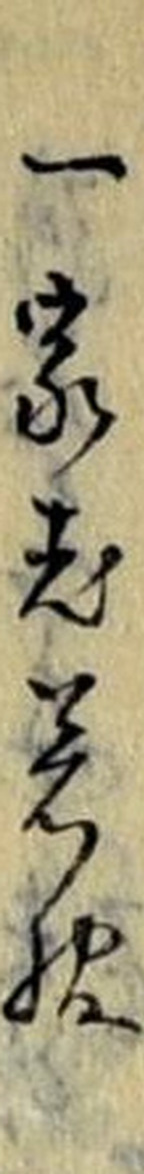一家老着服
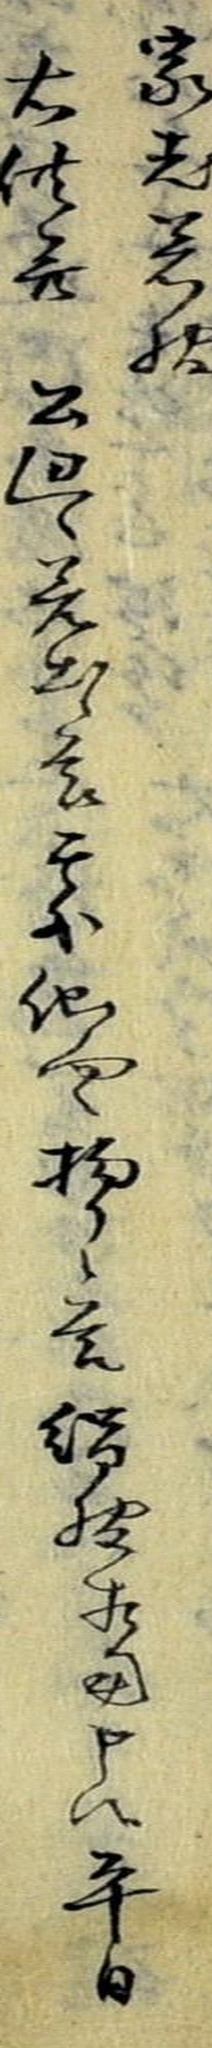右供并公辺へ差出候節其外他向へ拘り候節絹服相用申候平日
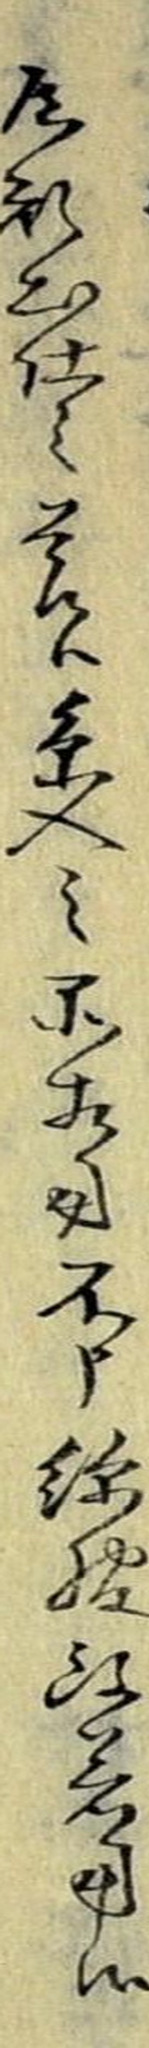屋形出仕之節は糸入之品相用不申綿服致着用候
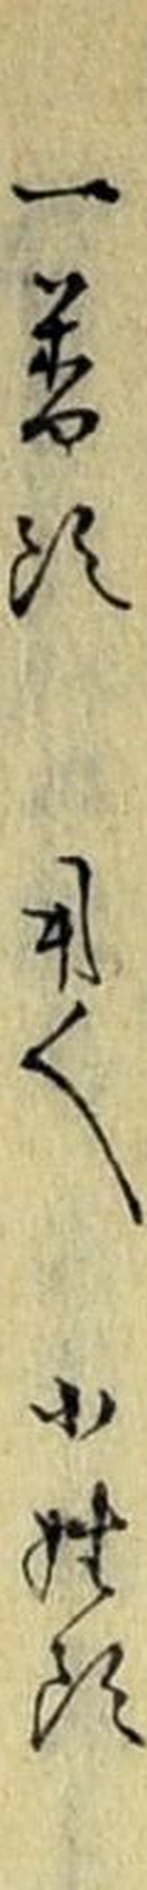一番頭用人小姓頭
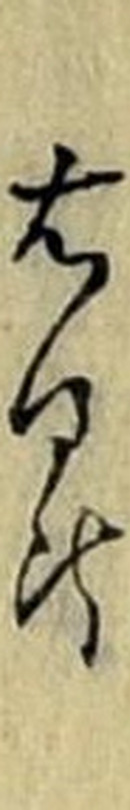右同断
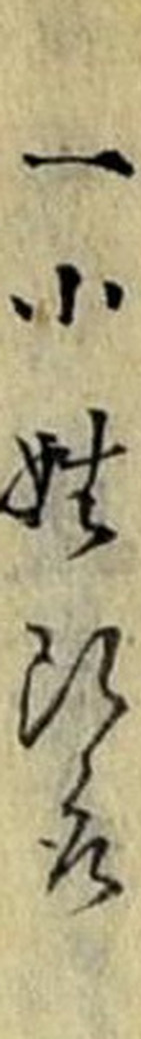一小姓頭取
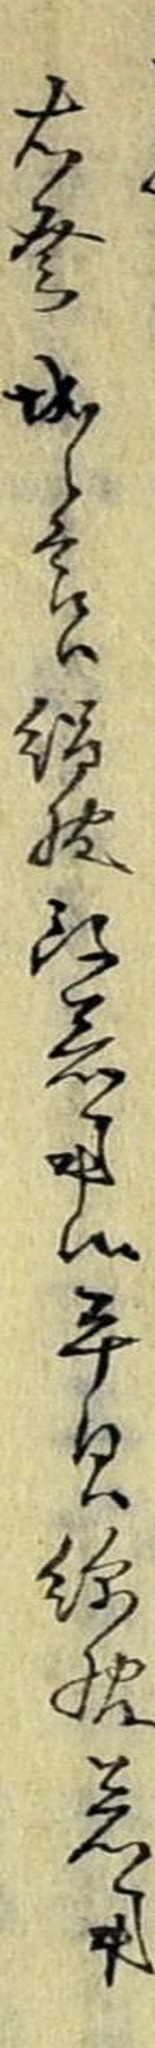右登城之節は絹服致着用候平日は綿服着用
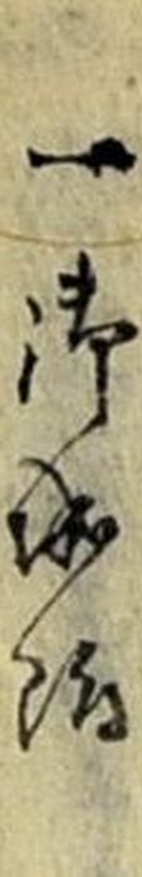一御城附
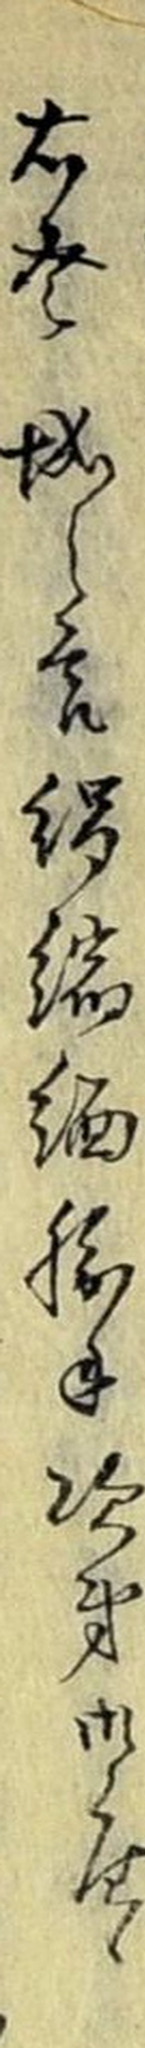右登城之節絹縮緬勝手次第御座候
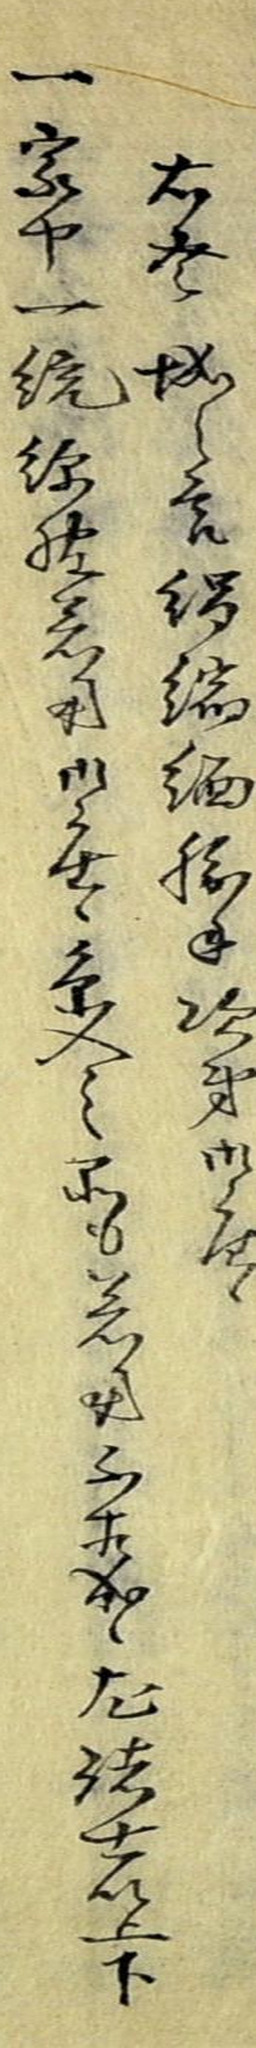一家中一統綿服着用御座候糸入之品も着用不相成候尤諸士以上下
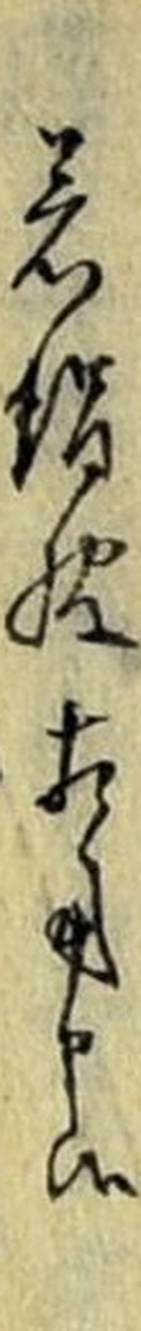着絹服相用申候
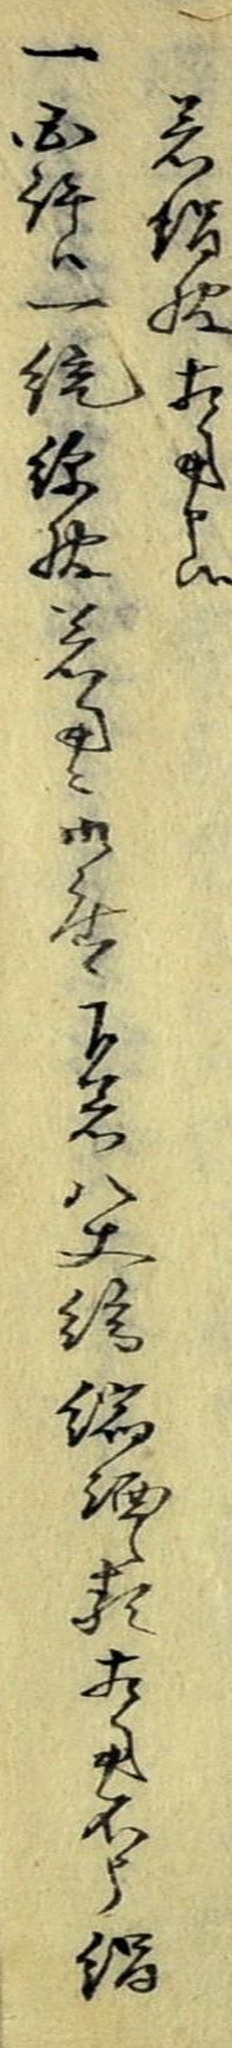一国許は一統綿服着用に御座候下着八丈縞縮緬之類相用不申絹

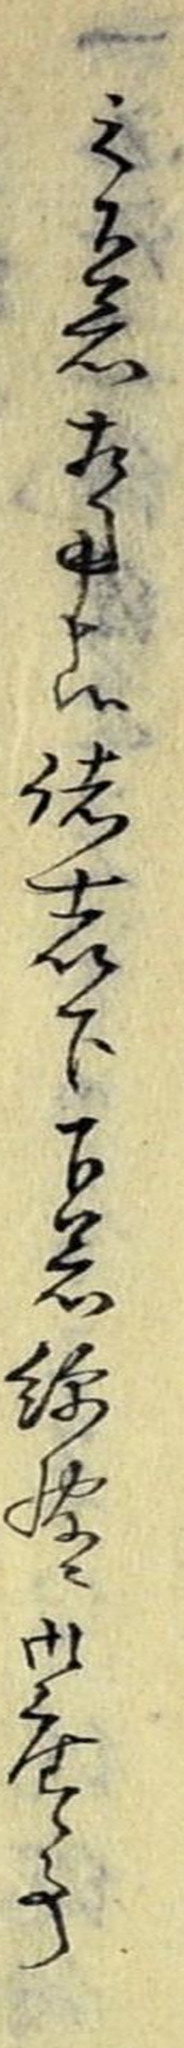之下着相用申候諸士以可下着綿服に御座候事
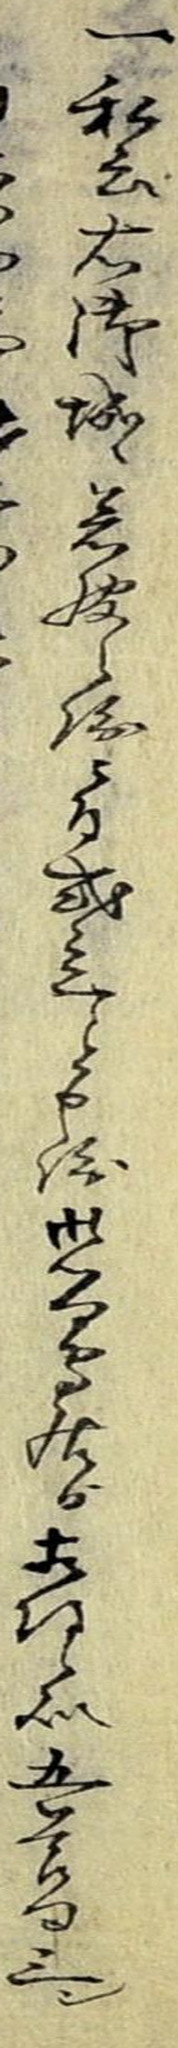一私云右御城へ着服之儀に付式立と申儀御留守居ゟ相伺候処五節句三ン
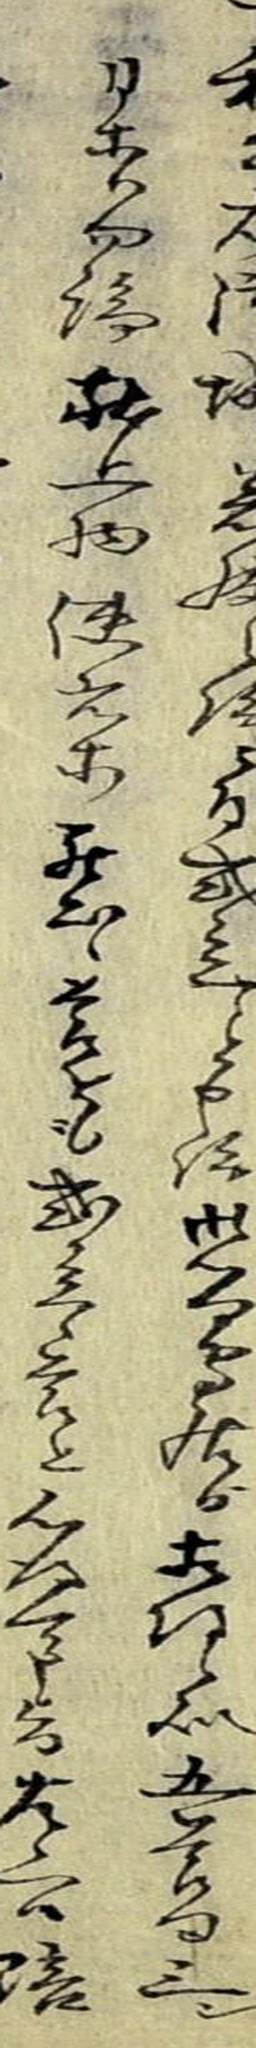日等は勿論献上物使者等罷出候節をも式立候節と心得可申旨左候へは陪
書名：命令之部 六
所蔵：福井県文書館 Fukui Prefectural Archives
